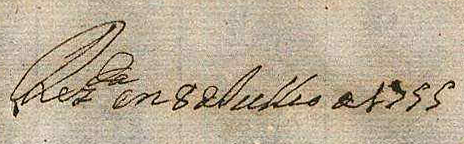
Rez.da en 8 de Iullio de 1755
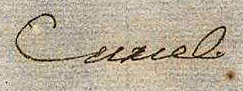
Curiel
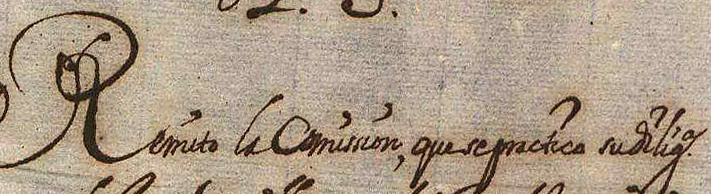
Remito la Comission, que se practico su dilig.a
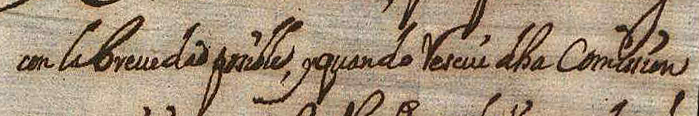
con la breuedad posible, y quando Reseui dha Comission
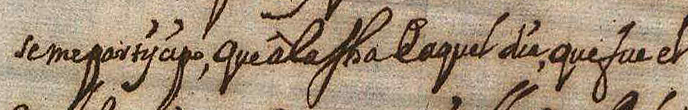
se me partiscipo, que â la fha de aquel dia, que fue el
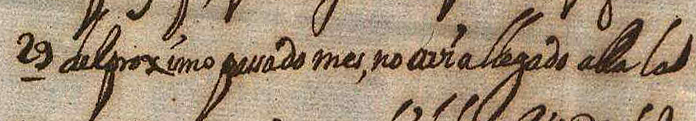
29 del proximo passado mes, no avia llegado alla la
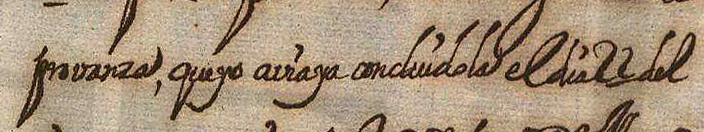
provanza, que yo avia ya concluidola el dia 22 del
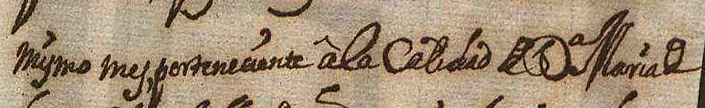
mismo mes, perteneciente â la Calidad de Da Maria de
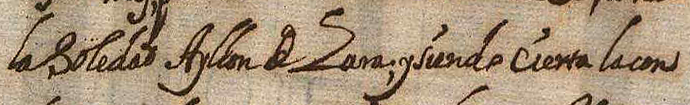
la Soledad Ayllon de Lara, y siendo cierta la con
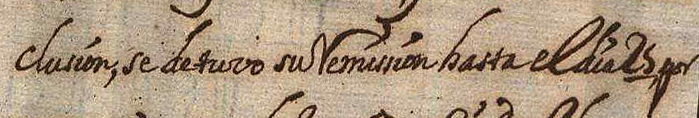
clusion, se detuvo su Remission hasta el dia 25 por
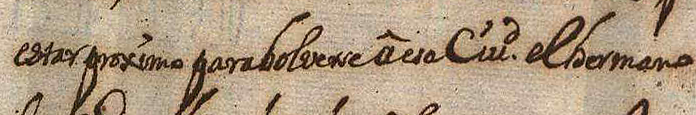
estar proximo para bolverse â esa Ciu.d el hermano
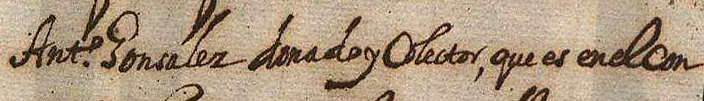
Ant.o Gonsalez donado y Colector, que es en el con
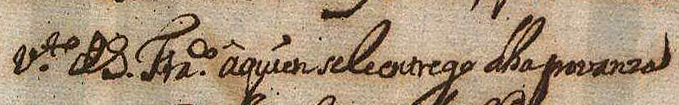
v.to de S. Fra.co â quien se le entrego dha provanza
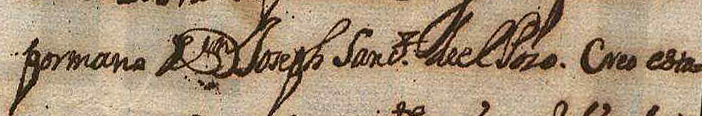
por mano de Don Ioseph Sanc.z de el Pozo. Creo esta
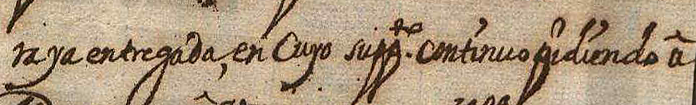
ra ya entregada, en cuyo supp.to continuo pidiendo â
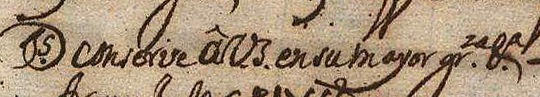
D.s conserve â VS. en su mayor gr.za &.a
